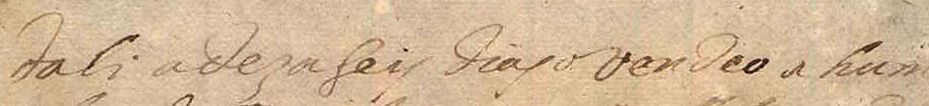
dali a dezaseis dias o vendeo a hum
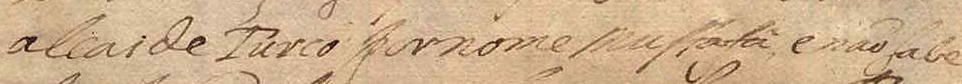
alcaide Turco por nome mustafâ, e naõ sabe
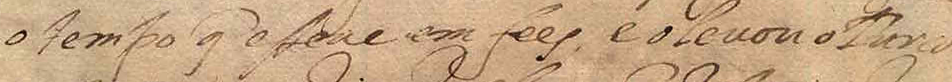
o tempo q̄ esteue em fees, e o leuou o Turco
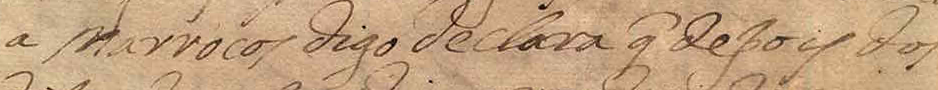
a Marrocos digo declara q̄ depois dos
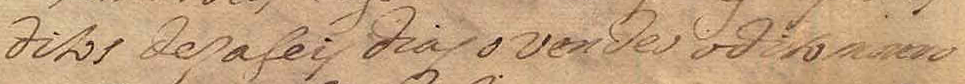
ditos dezaseis dias o vendeo o dito mouro
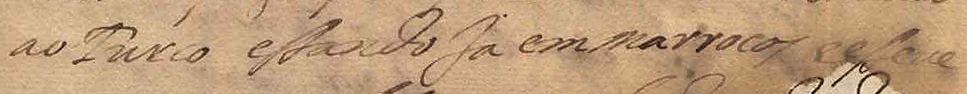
ao Turco estando Ja em marrocos E esteue
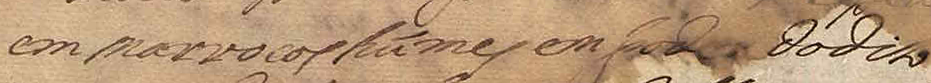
em marrocos hū mes em poder do dito
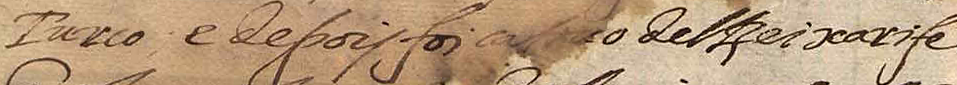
Turco, e depois foi catiuo del Rei xarife
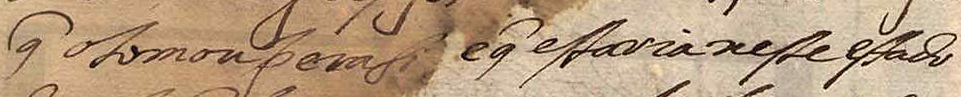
q̄ o tomou pera si e q̄ estaria neste estado
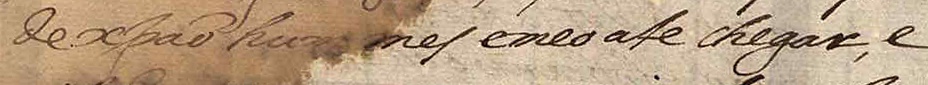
de xpaõ hum mes e meo ate chegar, e
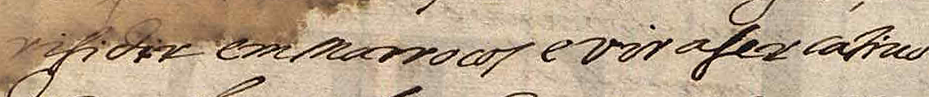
risidir em marrocos, e vir a ser catiuo
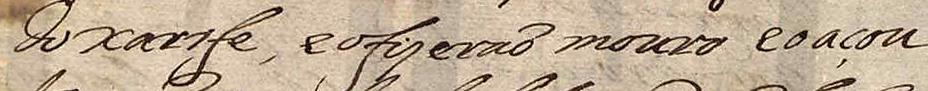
do xarife, e o fizeraõ mouro e o açou
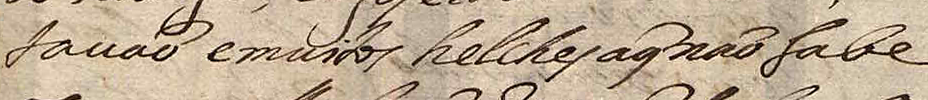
tauaõ e muitos helches a q̄ naõ sabe
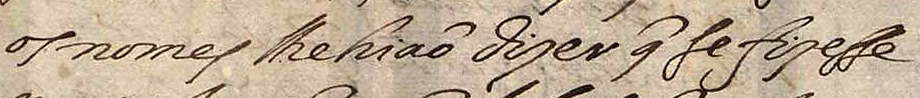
os nomes lhe hiaõ dizer q̄ se fizesse
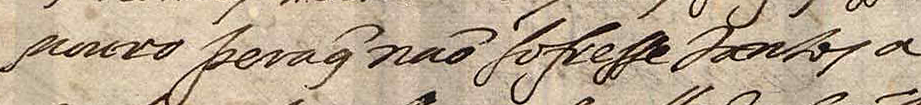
Mouro pera q̄ naõ sofresse tantos a
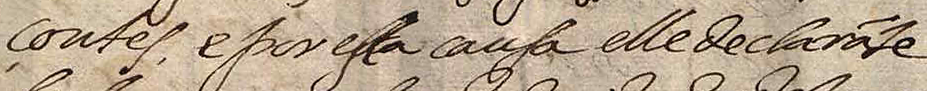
çoutes, e por esta causa elle declarāte
